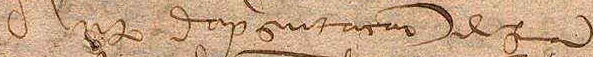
Auto dap̄sentacão de huā
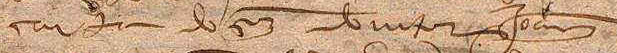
carta do s̄or douctor Joam
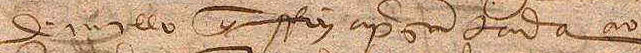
de mello q̄ ffoy ap̄sētada ao
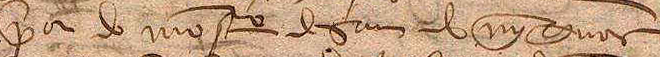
pior do mostro de sam dom̄jguos
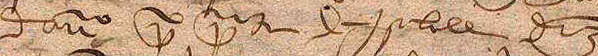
dauro p̄o p̄te de Jsabell dīz
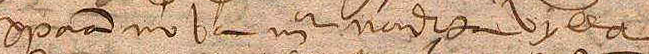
xpaā nova mor na dita vylla
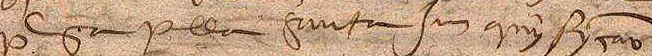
p̄sa pella santa Jmquysycão
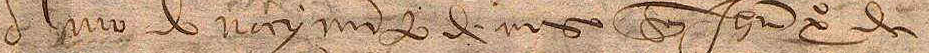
Anno do nacymēto de noso S̄or Jhū xo de
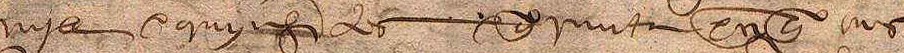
mjll e quynhētos e qoremta e c̄yqo aos
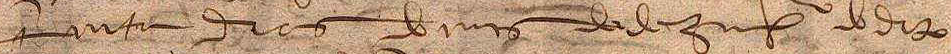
timta dias do mes de dezenbro do dito
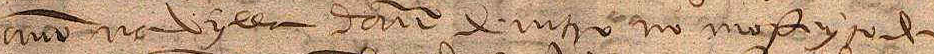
an̄o na vylla dauro demtro no mosteyro de
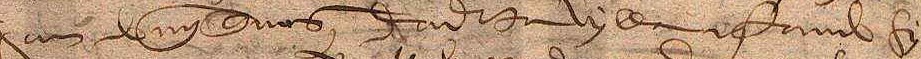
Sam dom̄jguos da dita vylla estando hy
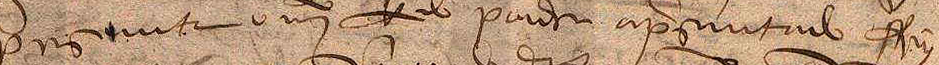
presemte o mto Rdo padre ap̄semtado ffrey
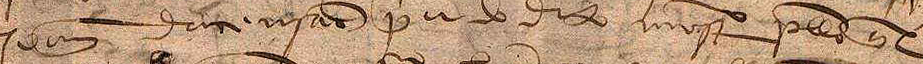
Joam dacensão pior do dito mostro p̄llo q̄l
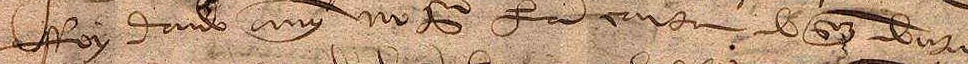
ffoy dado a m̄j notro huā carta do s̄or doutor
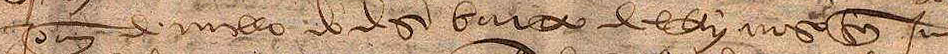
Joam de mello do desēbargo del Rey noso S̄or Jm
